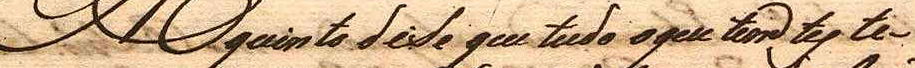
AO quinto diSe que tudo o que tem teste
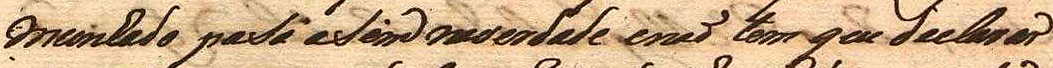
munhado paSa aSim na verdade e naõ tem que declarar
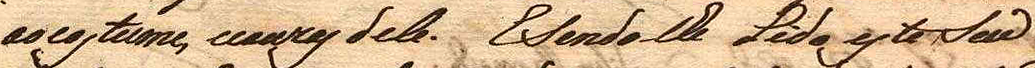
ao costume, e couzas dele. E Sendolhe Lido este Seu
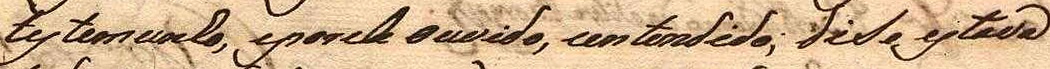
testemunho, e por ele ouvido, e entendido; diSe estava
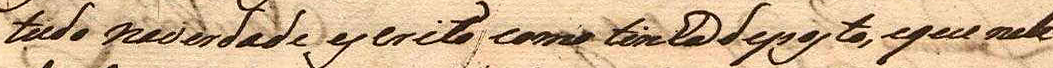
tudo na verdade escrito como tinha deposto, que nele
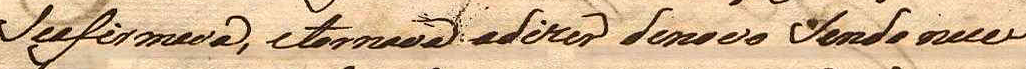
se afirmava, e tornava a dizer de novo sendo nece
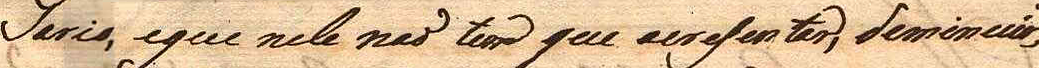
sario, e que nele naõ tem que acresentar, deminuir,
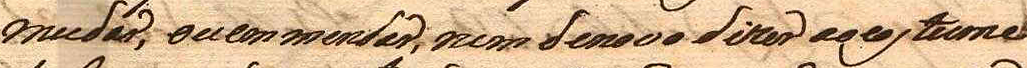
mudar, ou emmendar, nem de novo dizer ao costume
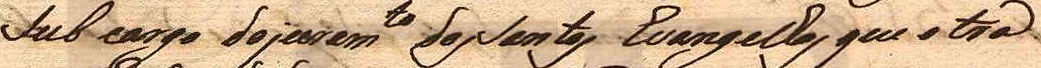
sub cargo do juramto dos santos Evangelhos que otra
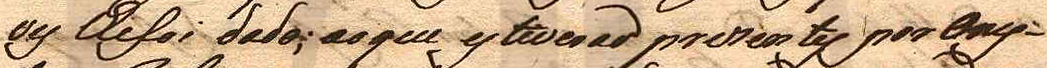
ves lhe foi dado; ao que estiveraõ prezentes por ones
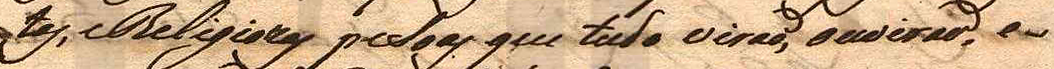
tas, e Religiozas peSoas que tudo viraõ, ouviraõ, e
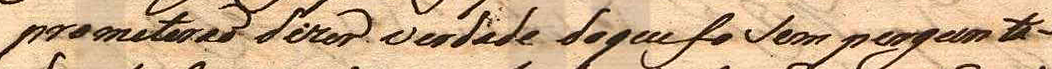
prometeraõ dizer verdade do que fosem pergunta
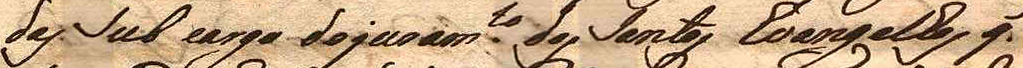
das sub cargo do juramto dos santos Evangelhos q̄
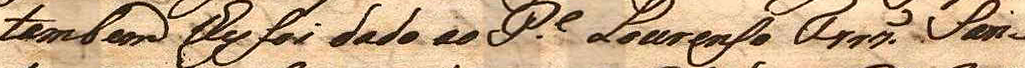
tambem lhes foi dado ao P.e Lourenso Frrz̄ San
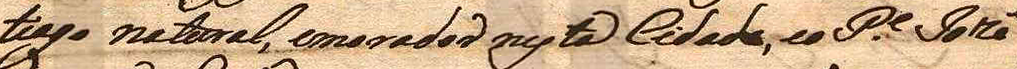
tiago natural, e morador nesta Cidade, e o P.e Iozé
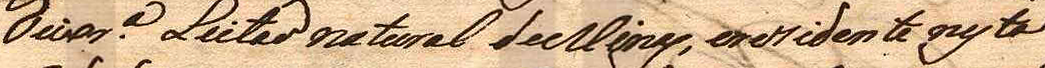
Teixr.a Leitaõ natural de Minas, e rezidente nesta
